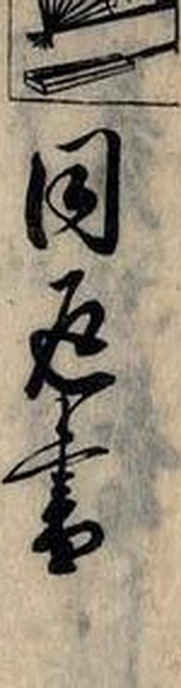同返書
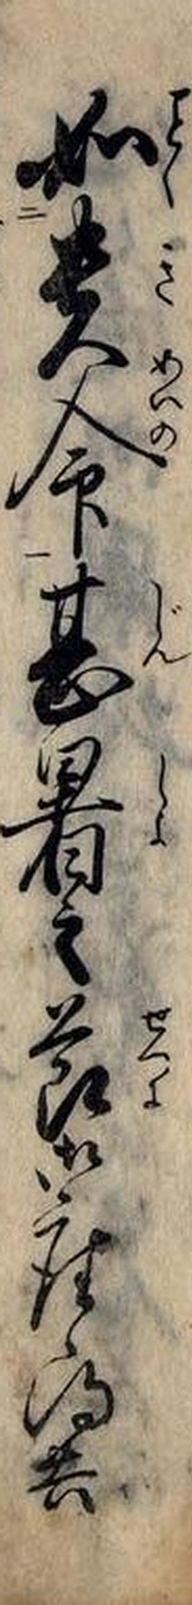如貴命甚暑之節御座候得共

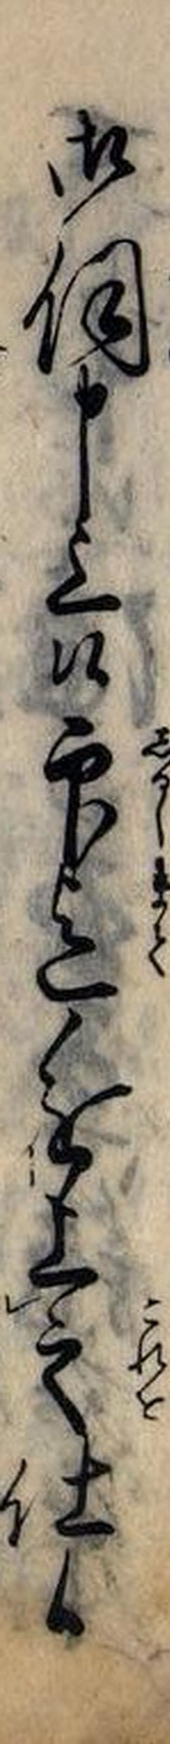御伺申上候印迄進-上之仕候
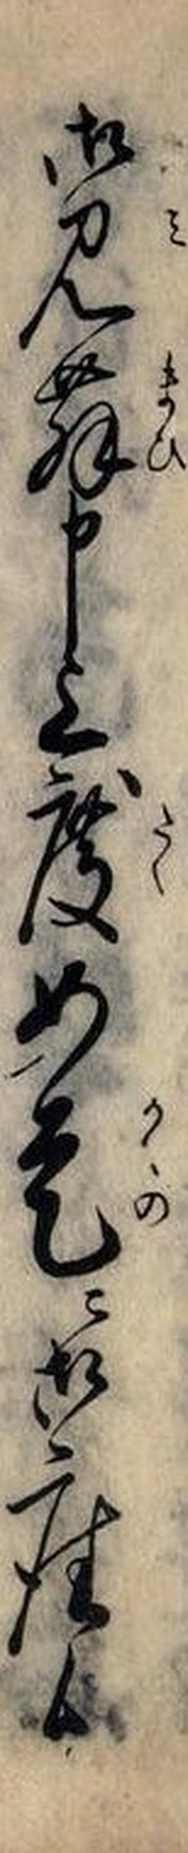御見舞申上度如是に御座候
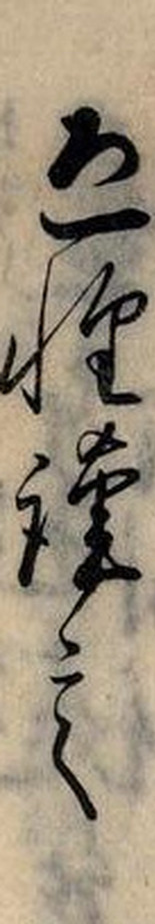恐惶謹言
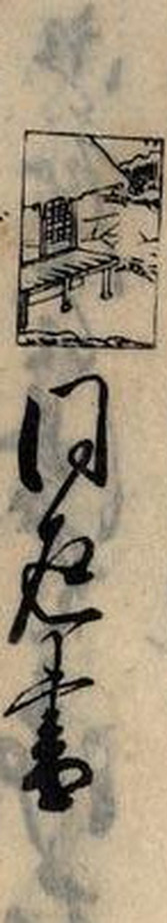同返書
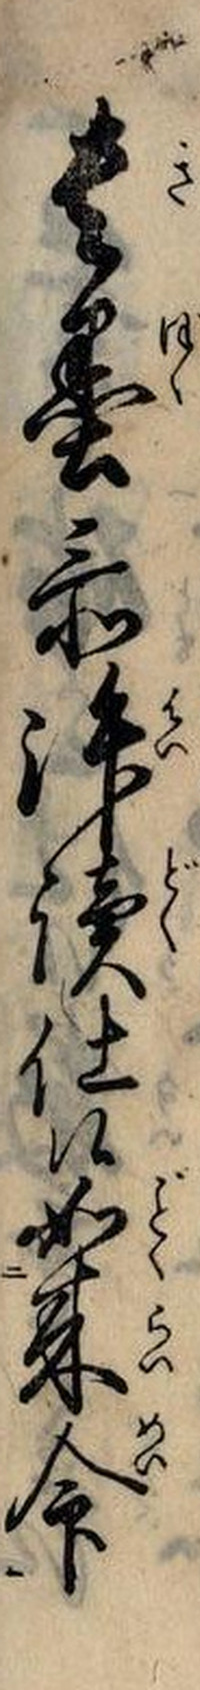貴墨忝拝讀仕候如来命
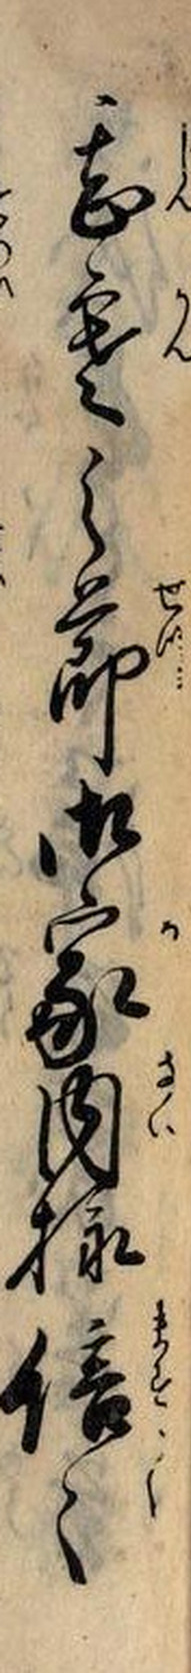甚寒之節御家内様倍々

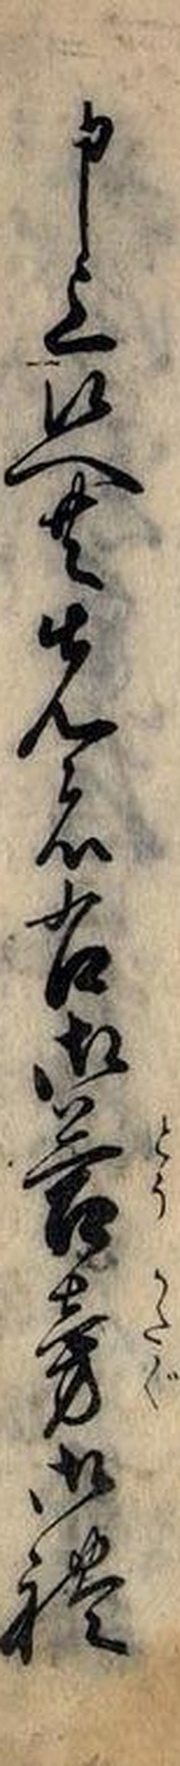申上候ヘ共先者右御答旁御禮
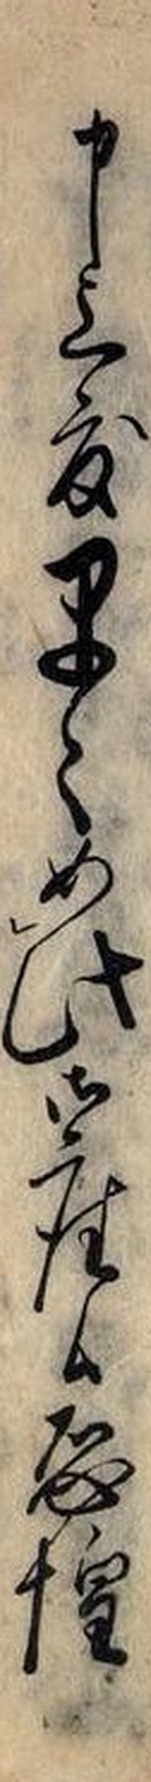申上度早々如此御座候恐惶
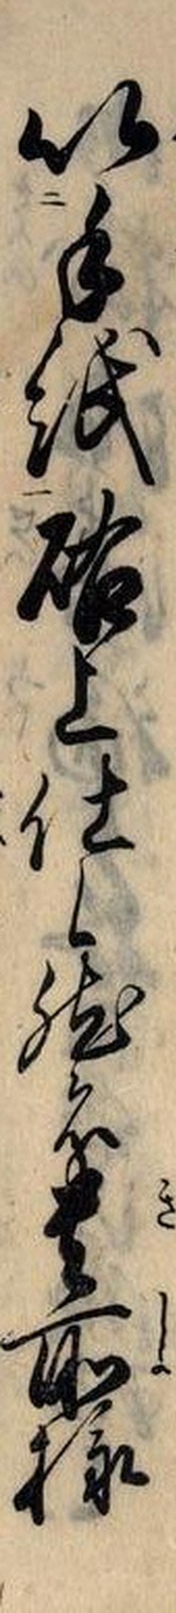以手紙啓上仕候然者貴所様
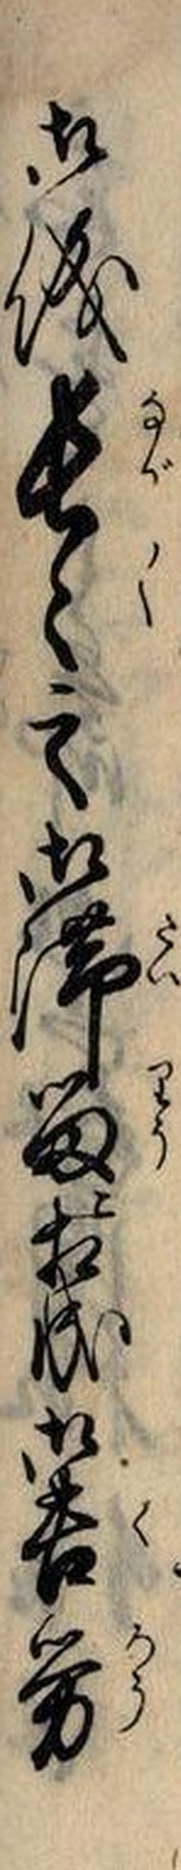御儀長々之御滞留に相成御苦労
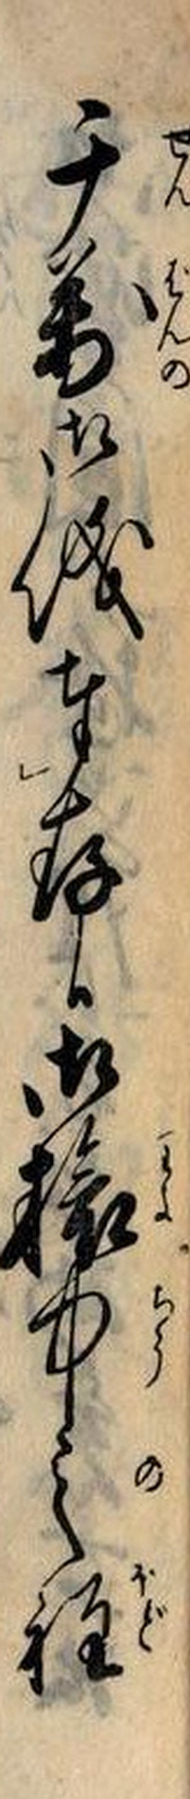千萬御儀奉存候御旅中之程
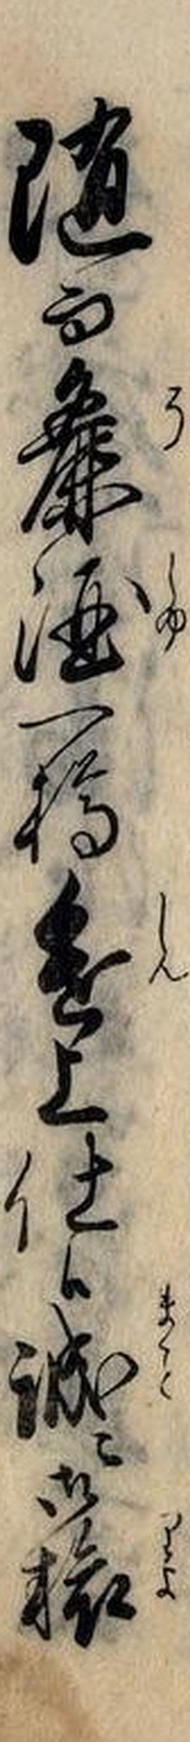随而麁酒一樽進上仕候誠に御旅
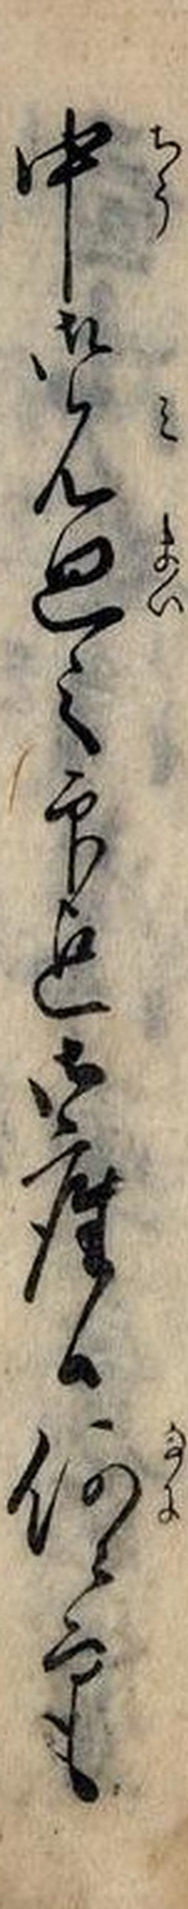中御見廻之印迄御座候何に而も
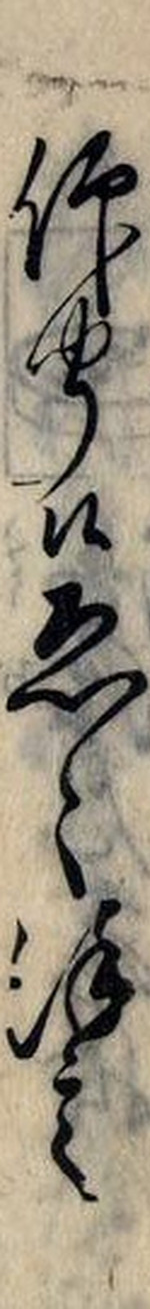仰聞候恐々謹言
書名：大成用文章（往来物）
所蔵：福井県文書館 Fukui Prefectural Archives
